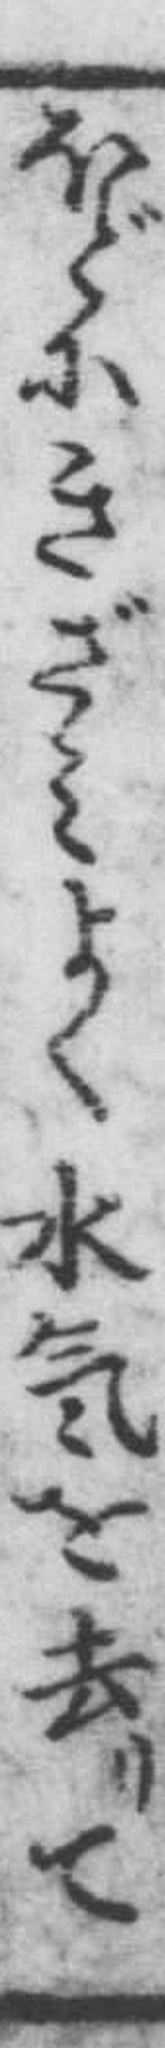ほどにきざミよく水気を去りて
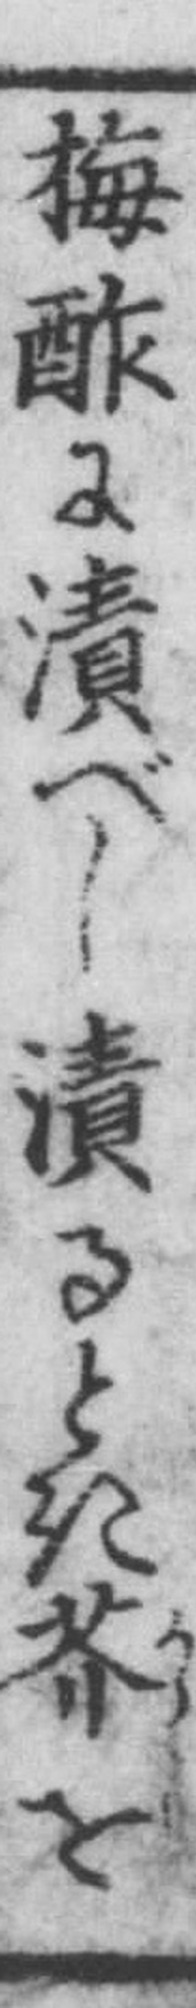梅酢に漬べし漬るとき芥を
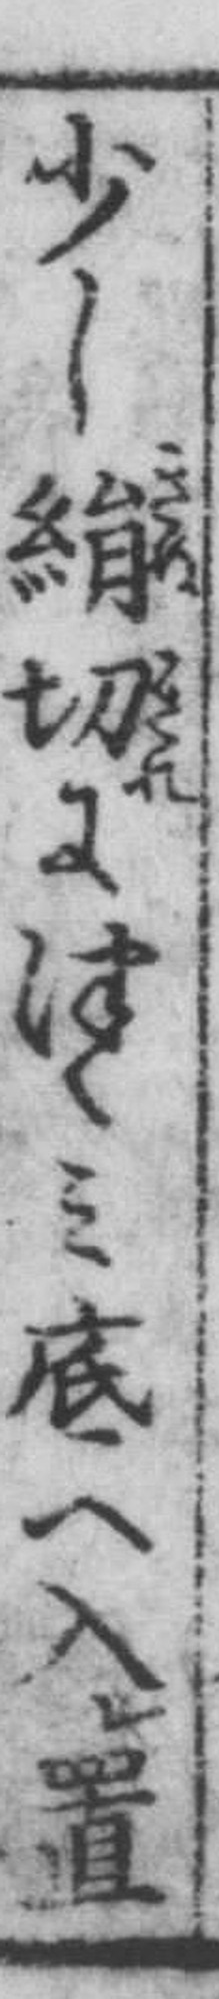少し絹切につゝミ底へ入レ置
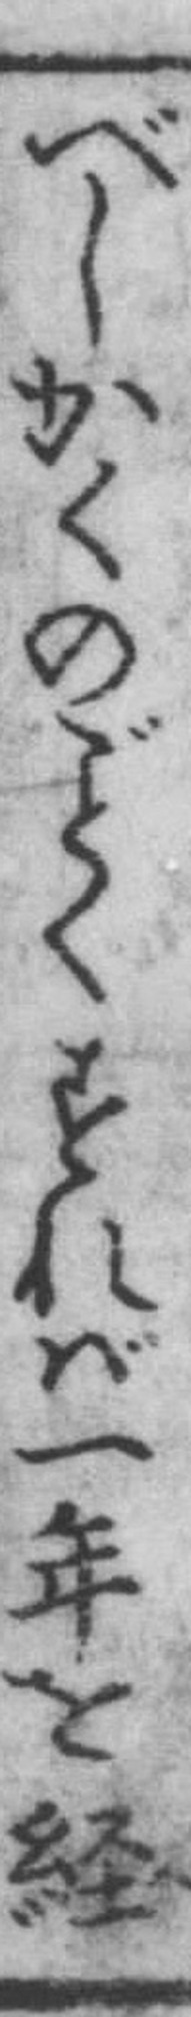べしかくのごとくすれバ一年を経

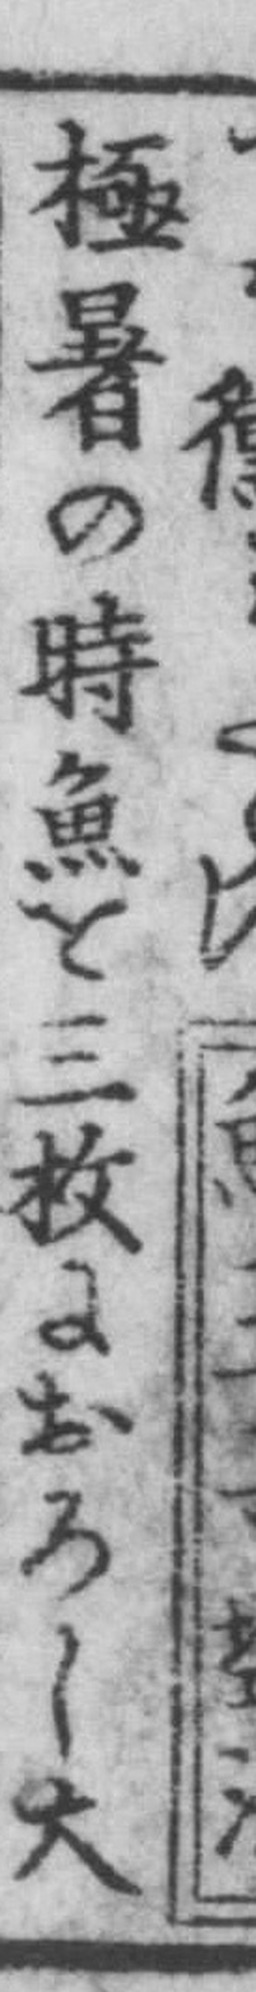極暑の時魚を三枚におとし大
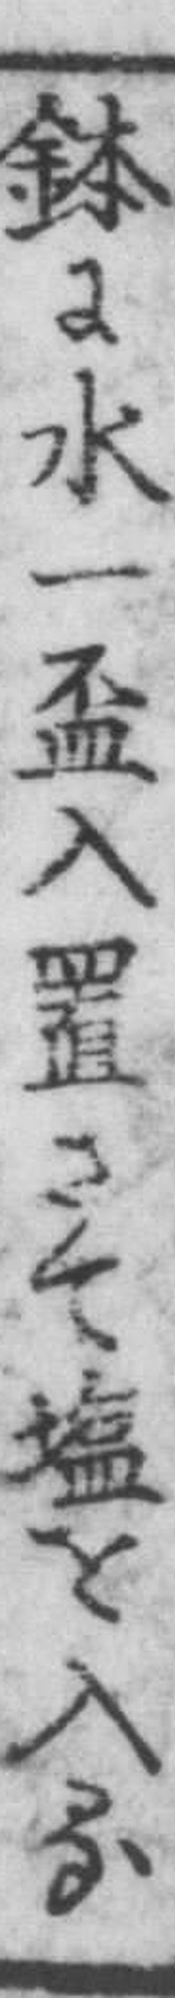鉢に水一盃入置さて塩を入る
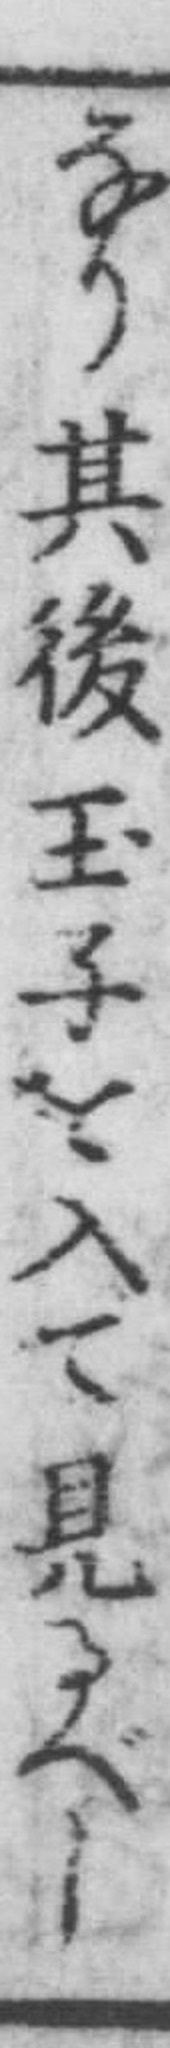な其後玉子を入て見るべし
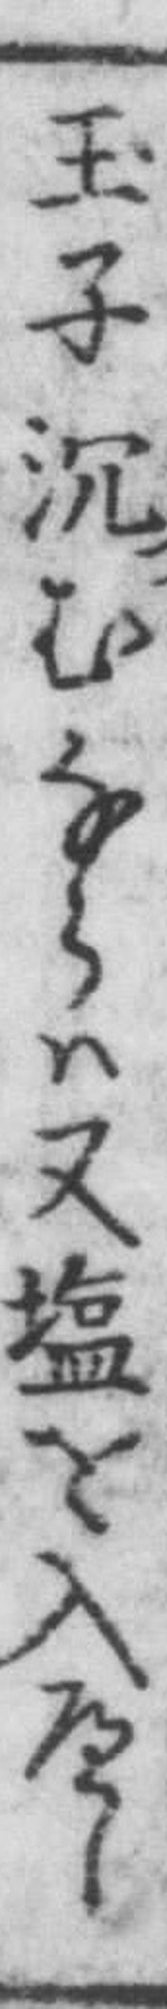玉子沈むならハ又塩を入べし
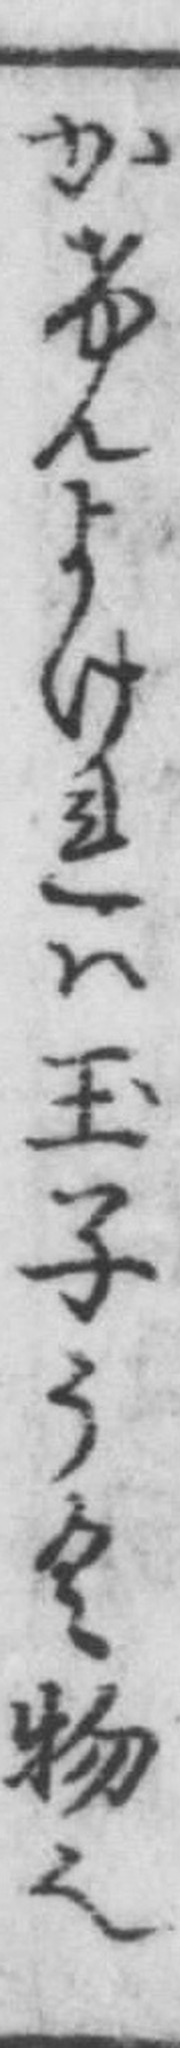かけんよけれハ玉子うを物之
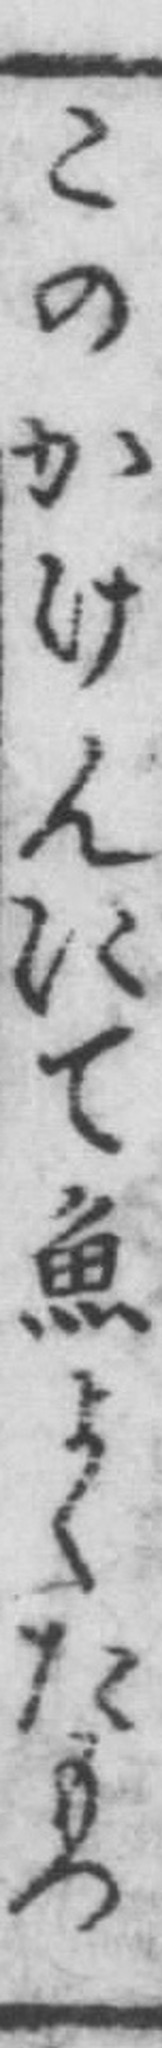このかけんにて魚よくたもつ
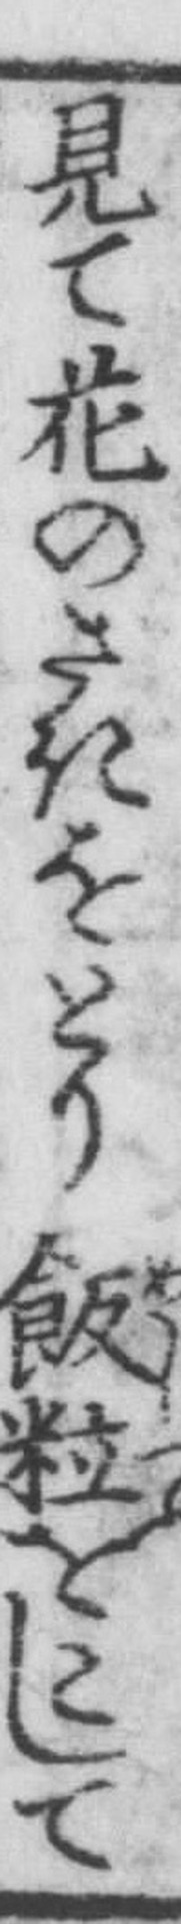見て花のさきをとり飯粒をこして
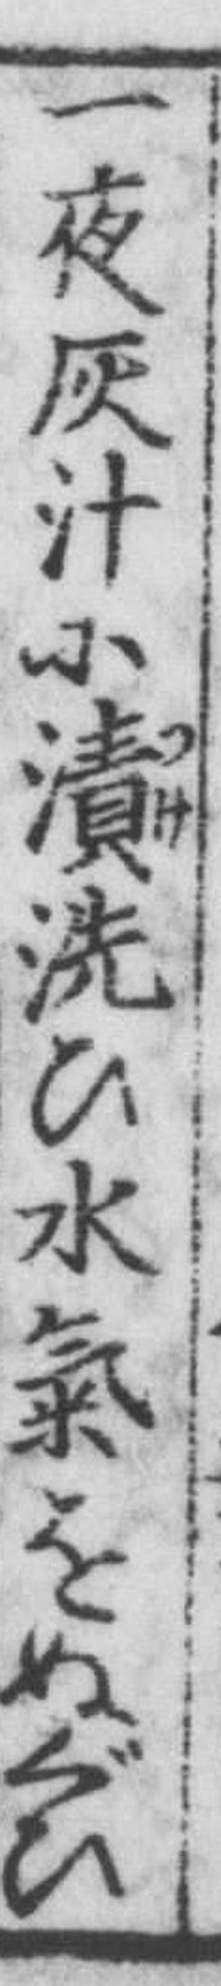一夜灰汁に漬洗ひ水氣をぬぐひ
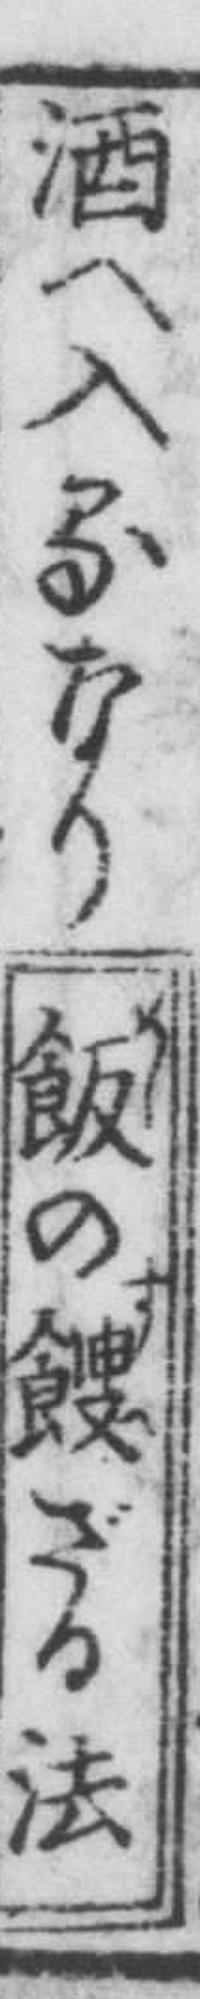酒へ入るなり飯の饐ざる法
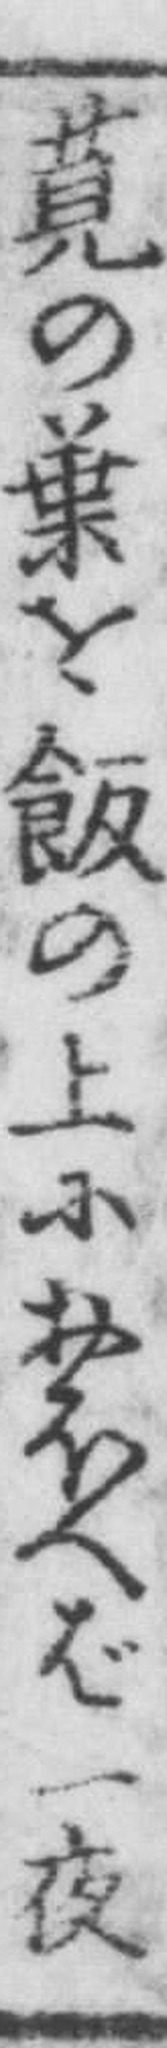莧の葉を飯の上におほへば一夜
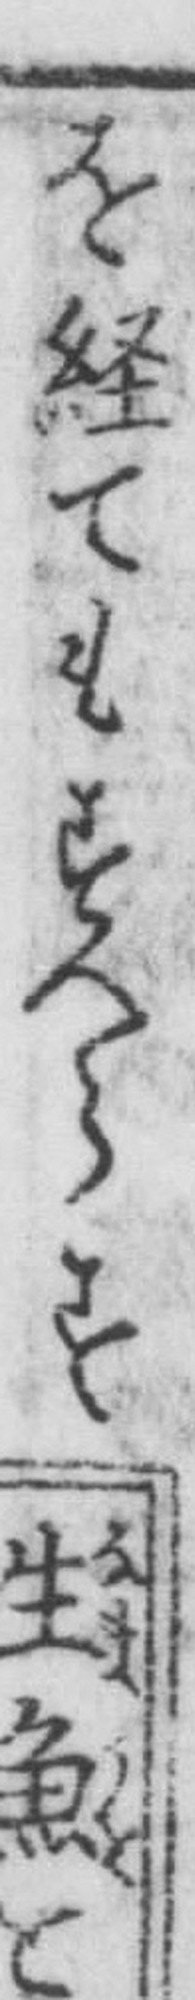を経てもすへらず生魚を
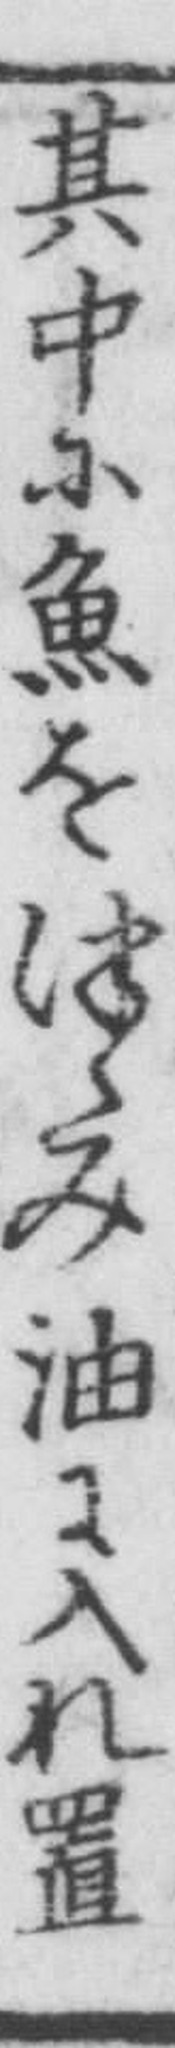其中に魚をはさみ油に入置
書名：当世料理筌
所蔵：大阪府立大学学術情報センター 国文学研究資料館
